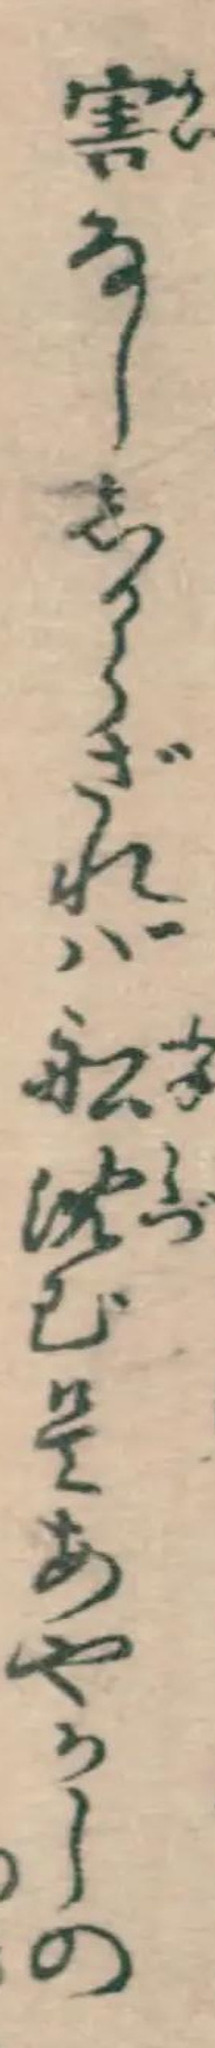害なししからざれば船沈む是あやかしの
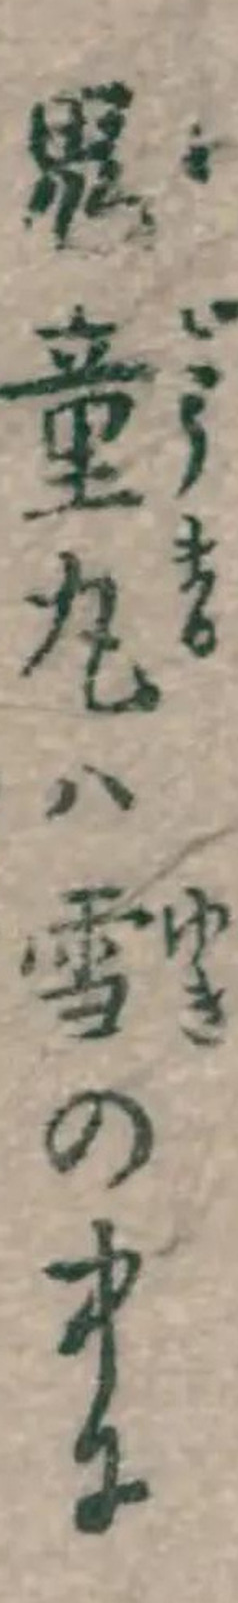鬼童丸は雪の中に
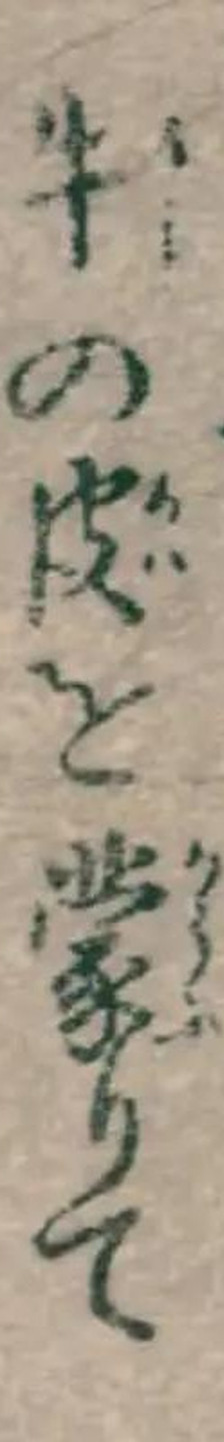牛の皮を蒙りて
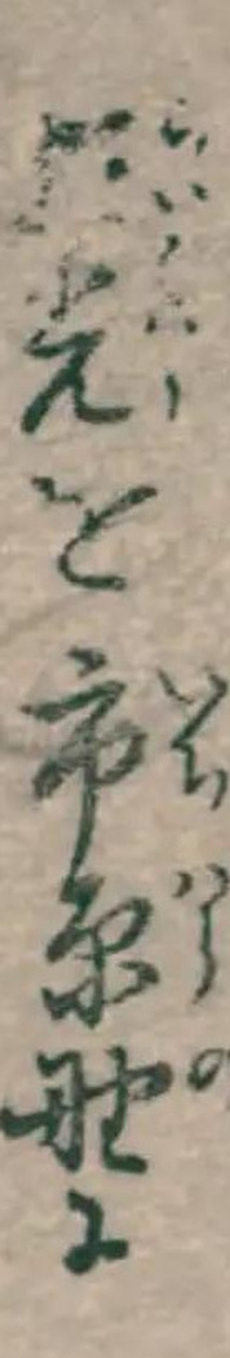頼光を市原野に

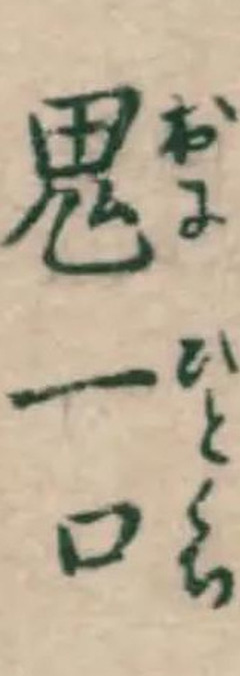鬼一口
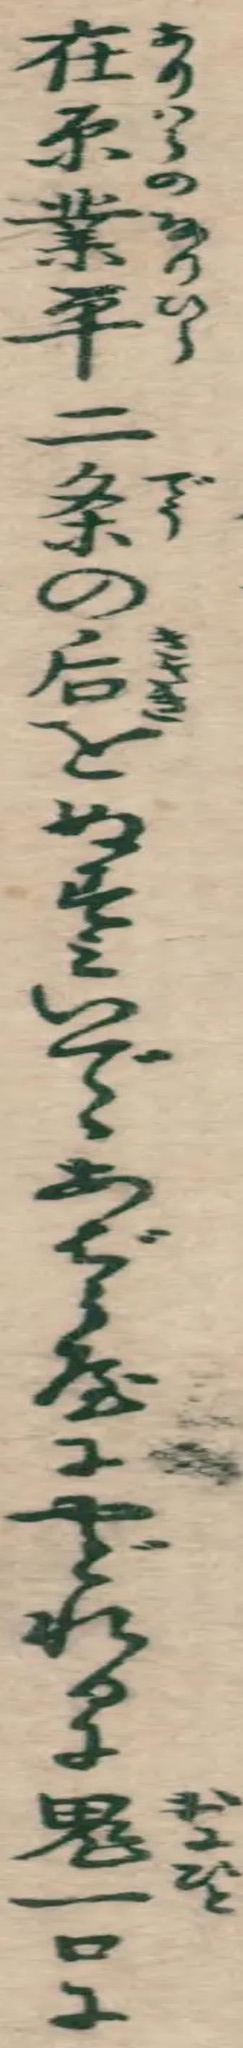在原業平二条の后をぬすみいでゝあばら屋にやどれるに鬼一口に
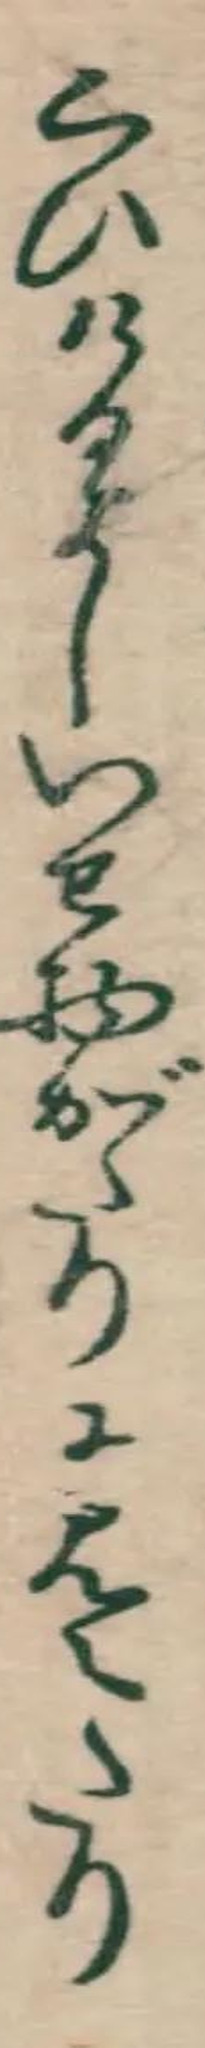くひけるよしいせ物がたりに見へたり
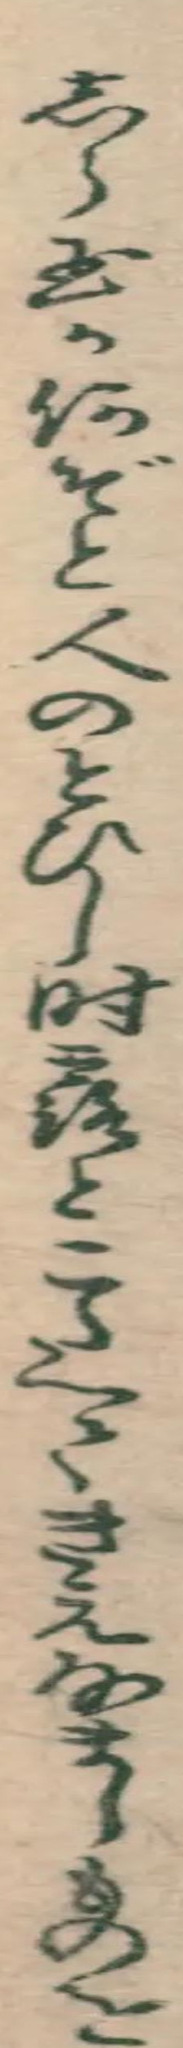しら玉か何ぞと人のとひし時露とこたへてきえなましものを
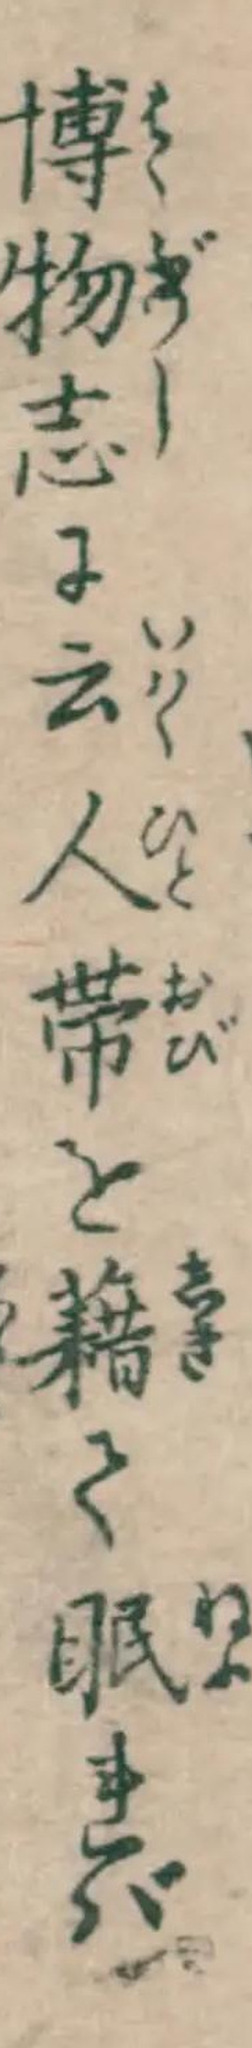博物志に云人帯を籍て眠れば
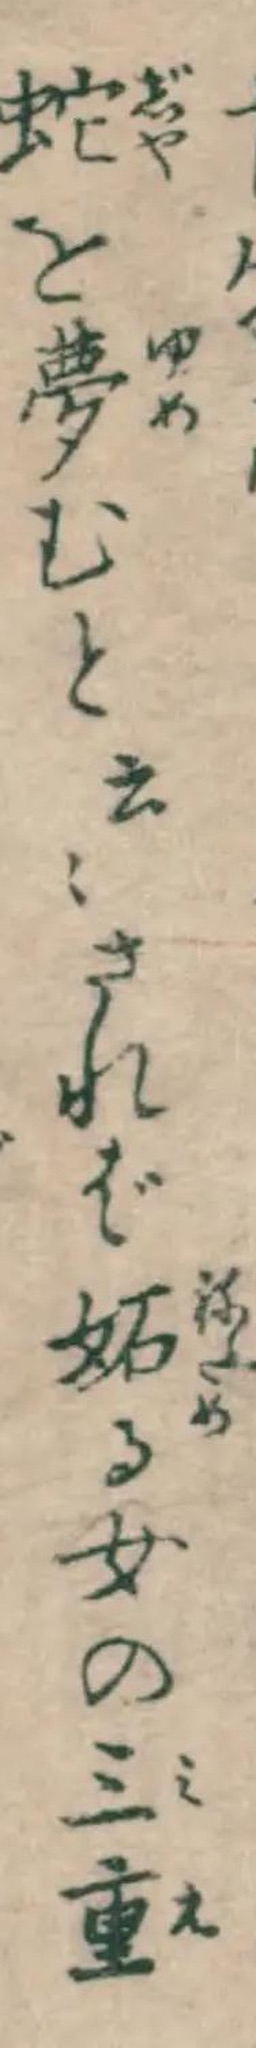蛇を夢むと云々されば妬る女の三重
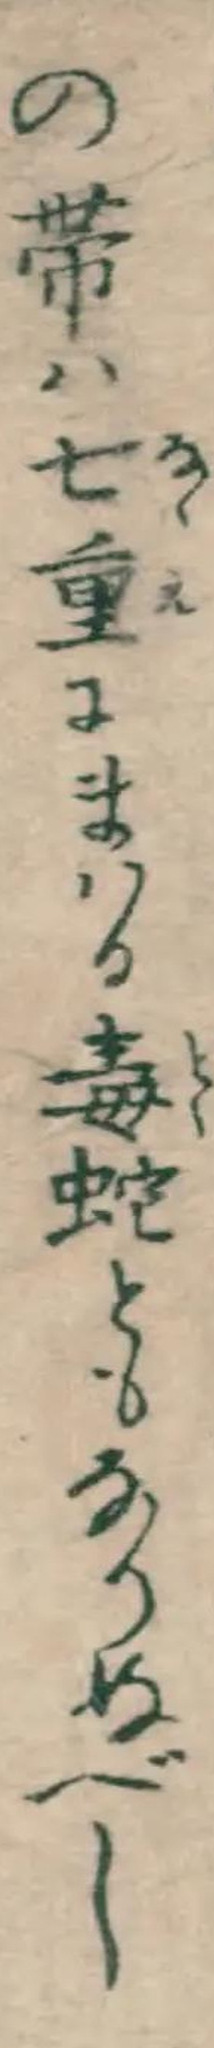の帯は七重にまはる毒蛇ともなりぬべし
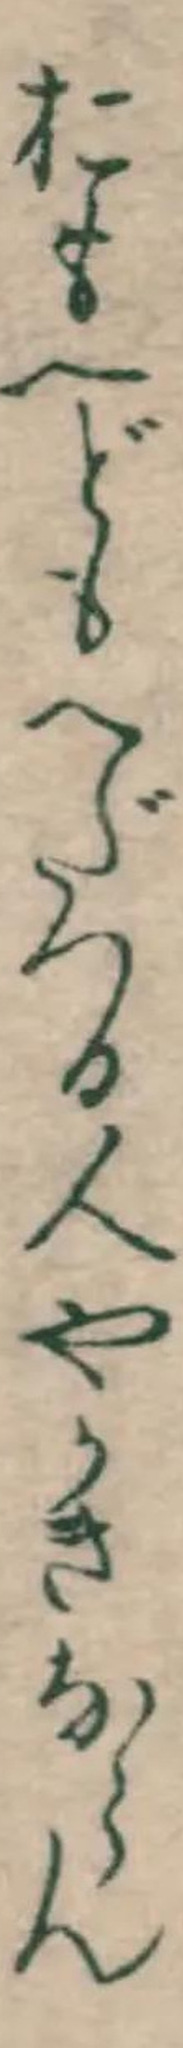おもへどもへだつる人やかきならん
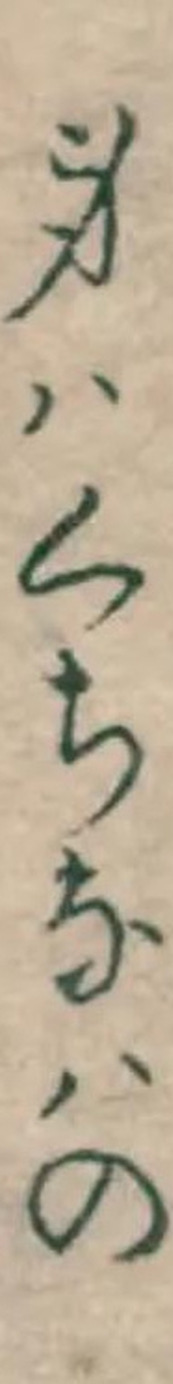身はくちなはの
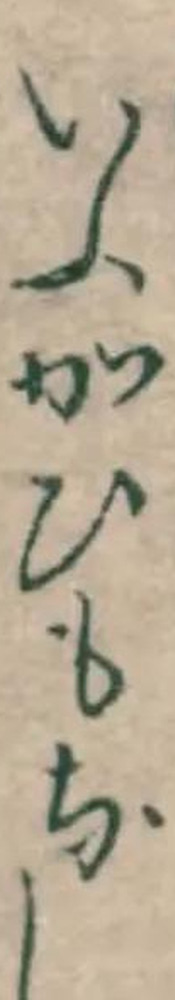いふかひもなし

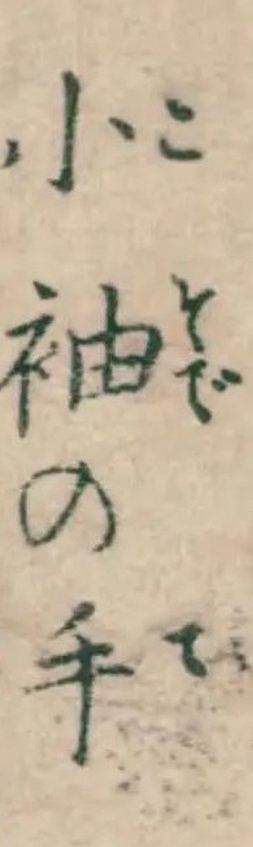小袖の手
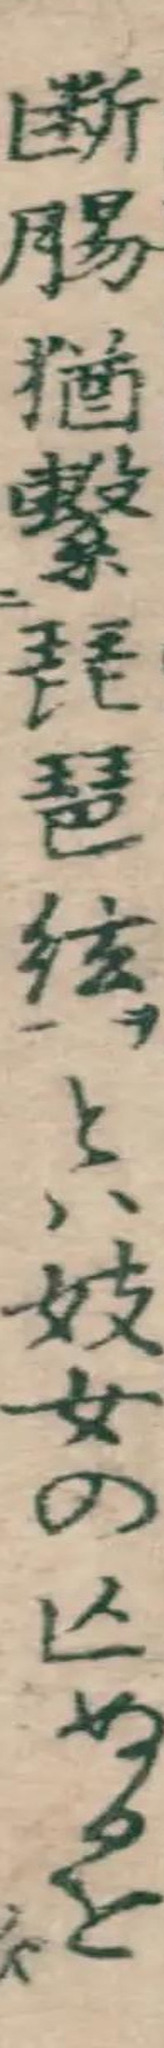断腸猶繋琵琶絃とは妓女の亡ぬるを
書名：百鬼夜行 3巻拾遺3巻. [2]
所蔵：国立国会図書館 National Diet Library, JAPAN
